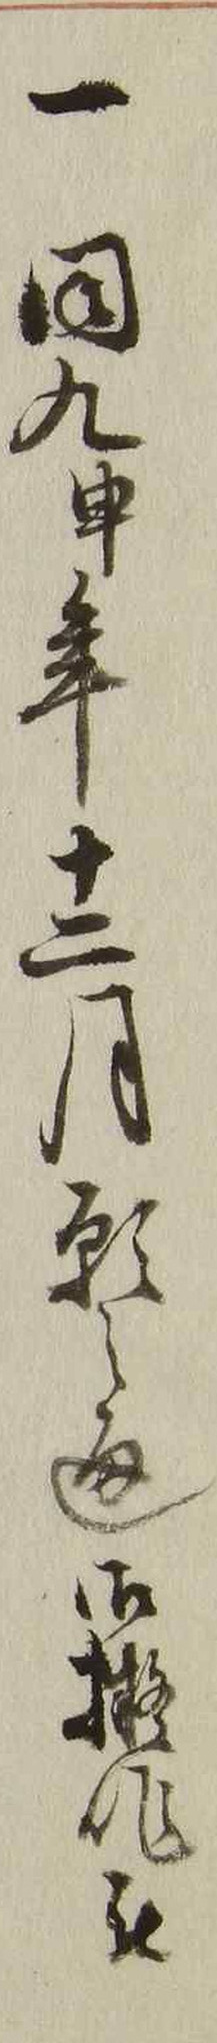一同九申年十二月願之通御擬作被
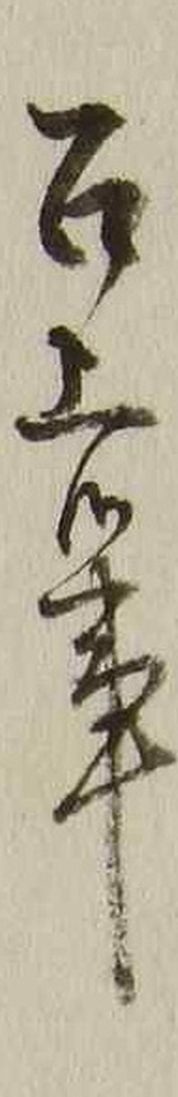召上候事
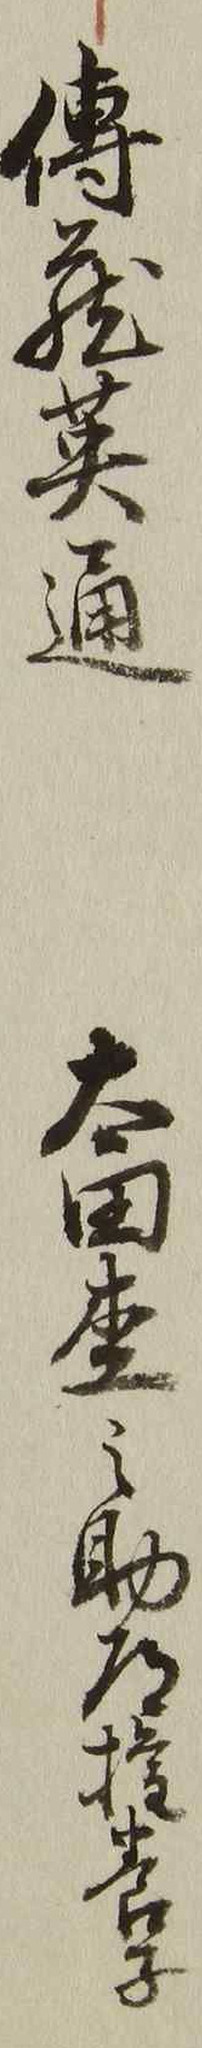伝蔵英通太田杢之助道権養子
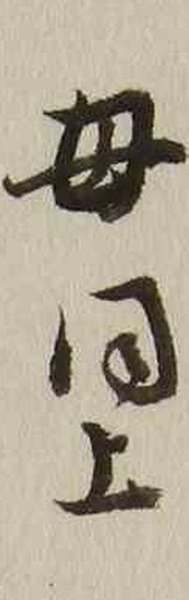母同上
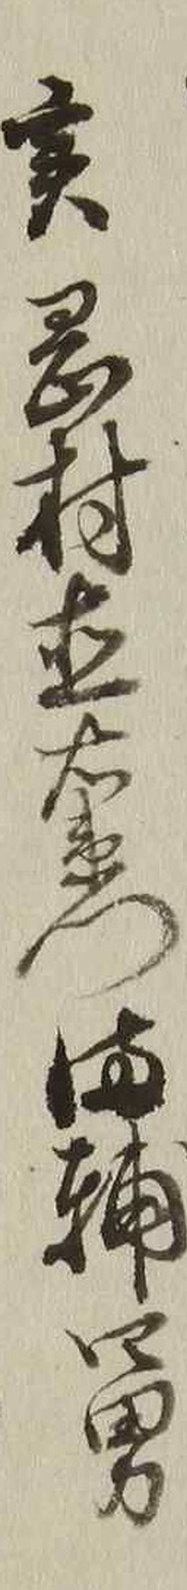実岡村直右衛門満輔四男
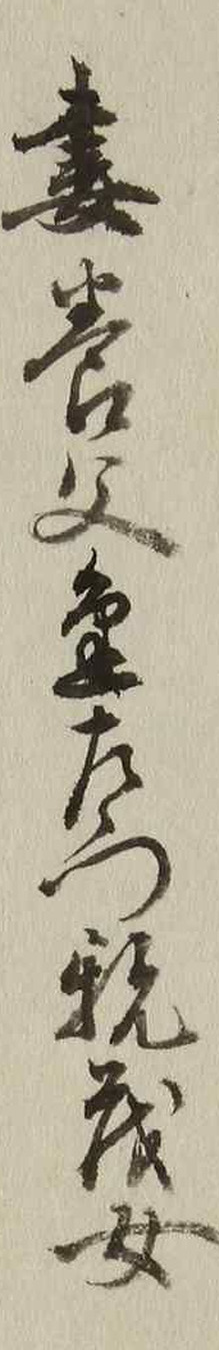妻養父金左衛門親茂女
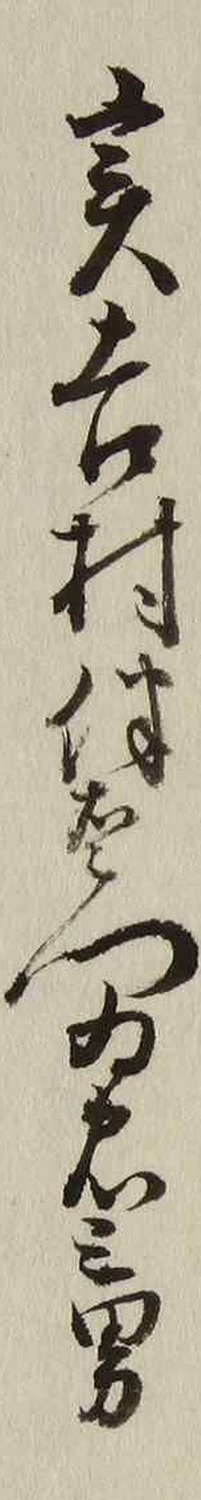実吉村伴右衛門為忠三男
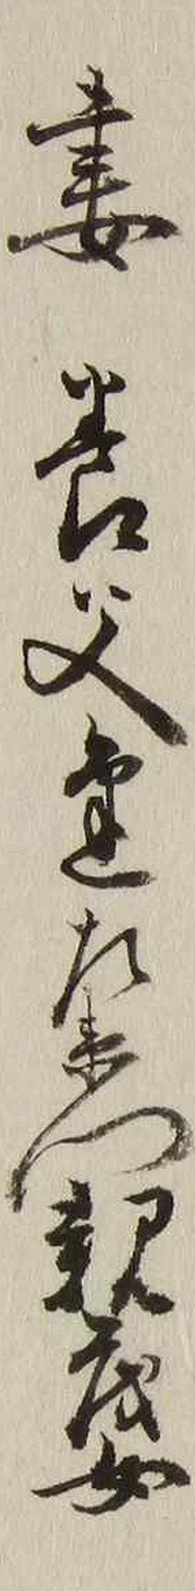妻養父金左衛門親茂女
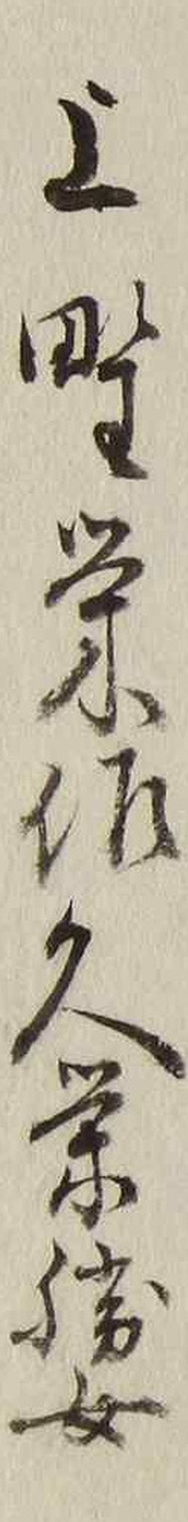上野栄作久栄勝女

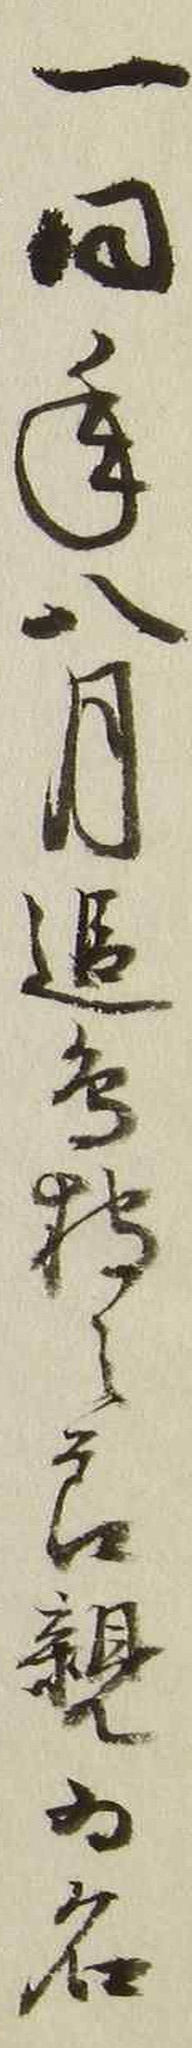一同年八月追鳥狩之節親為名
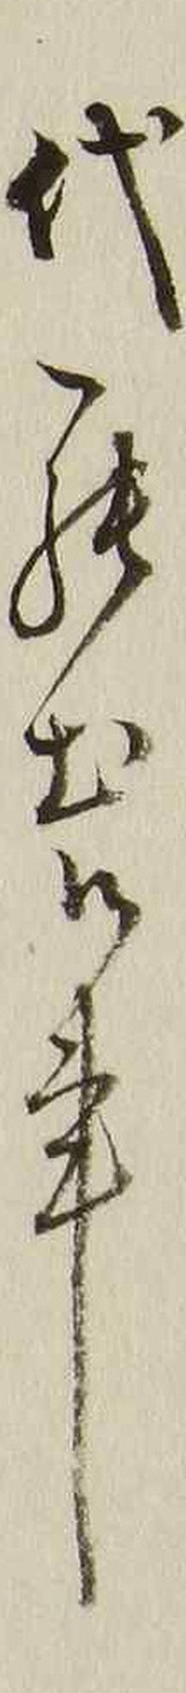代罷出候事
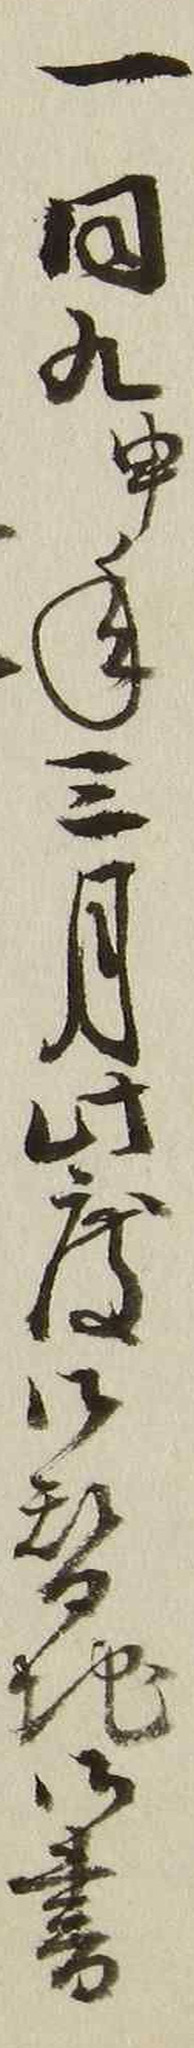一同九申年三月此度御替地御書
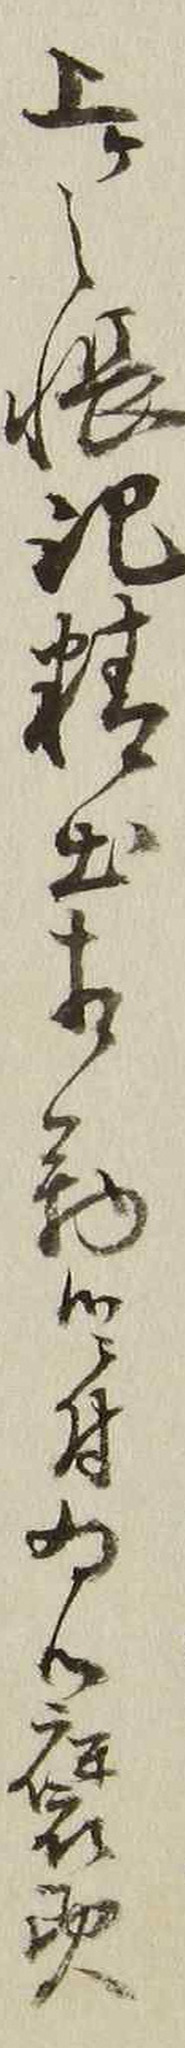上ヶ之帳記精出相勤候ニ付為御褒美
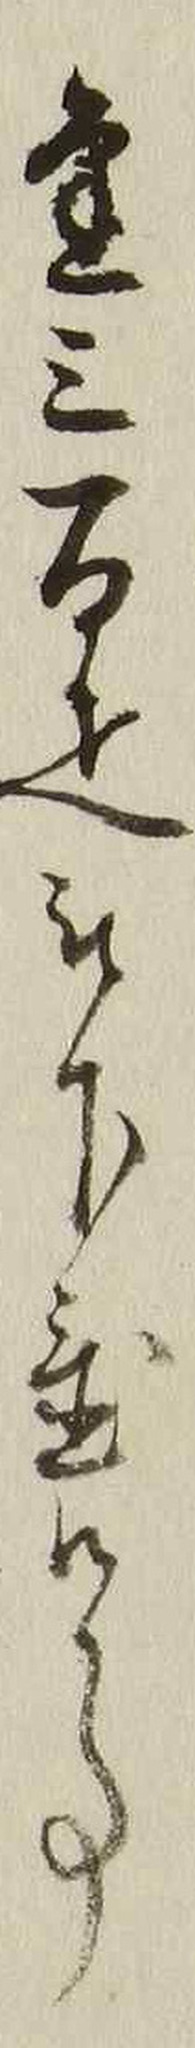金三百疋被下置候事
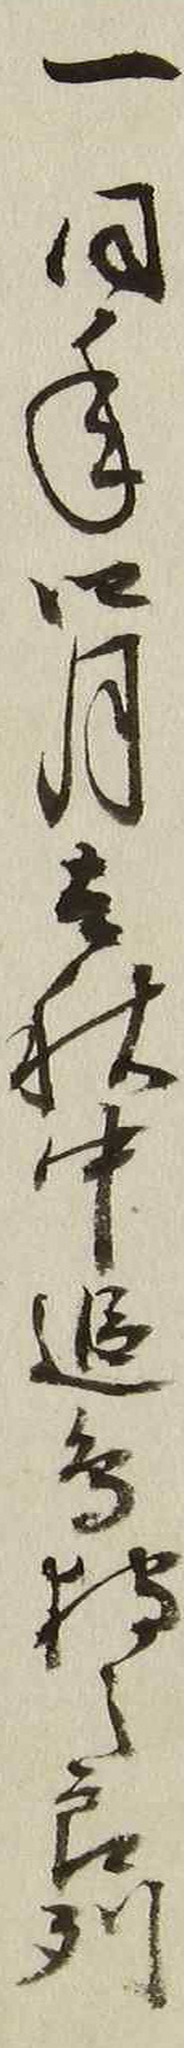一同年四月去秋中追鳥狩之節列
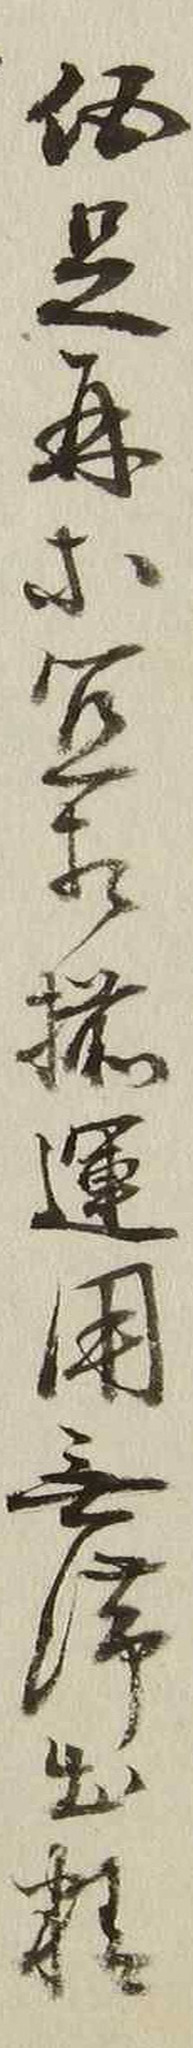伍足並等宜相揃運用無滞出精
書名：諸士系譜　巻之39　は之部7
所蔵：会津若松市立会津図書館
